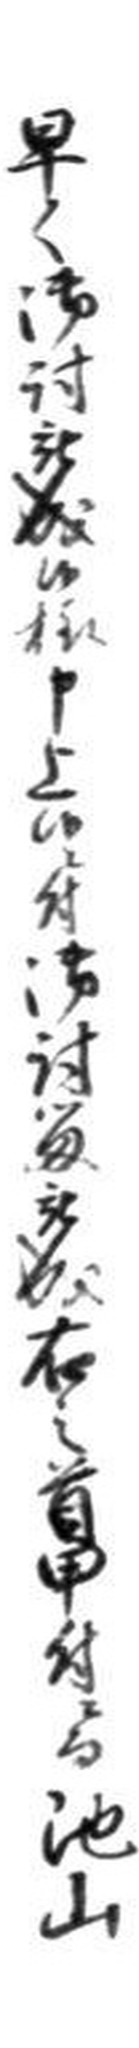早く御討被成候様申上候ニ付御討留被成右之首甲付ニ而池山
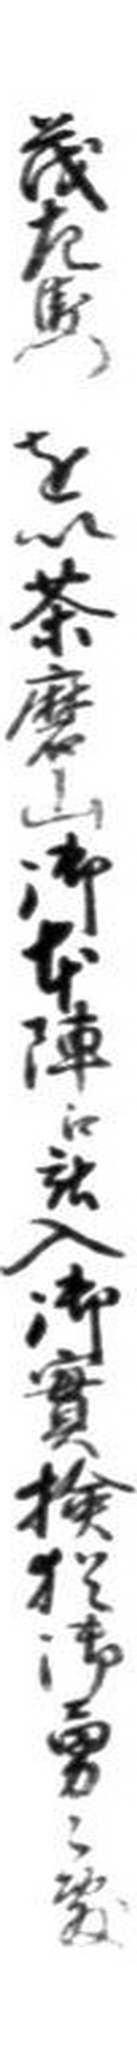茂左衛門を以茶磨山御本陣江被入御実検猶御勇々敷
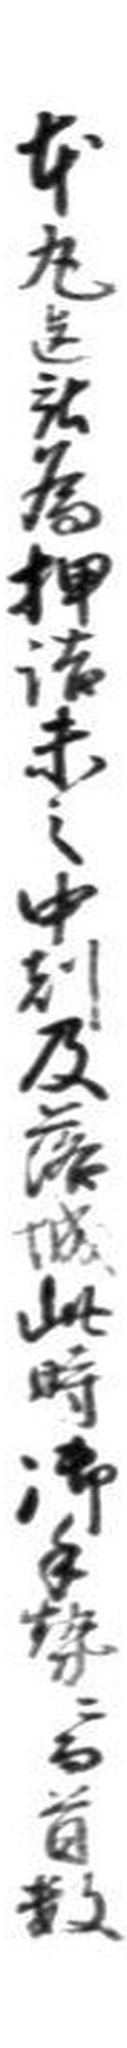本丸迄被為押詰未之中刻及落城此時御手勢ニ而首数
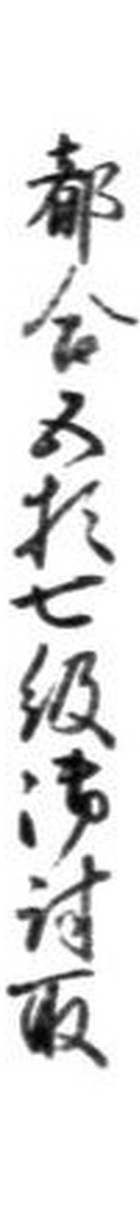都合五拾七級御討取
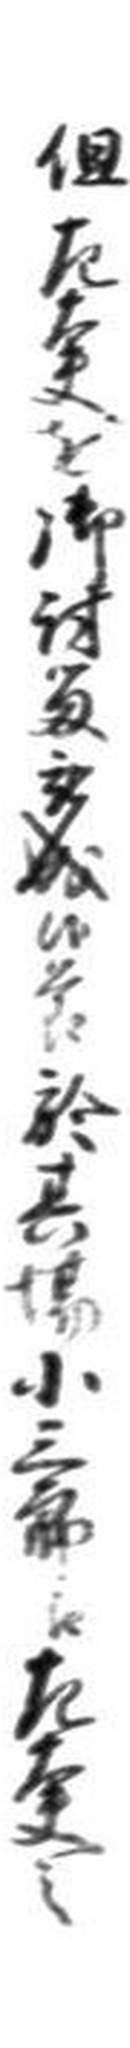但左大夫を御討留被成候節於其場小三郎江左大夫之
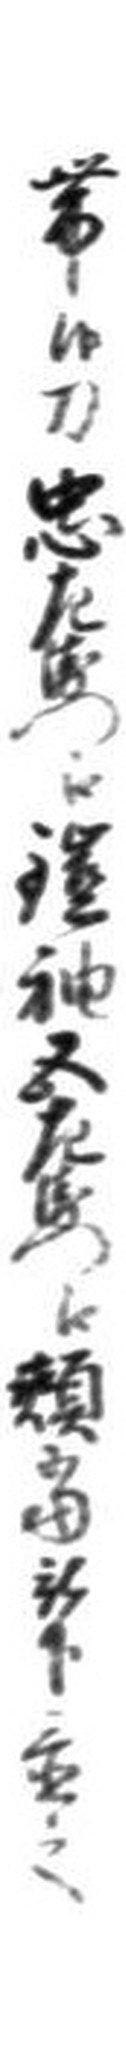帯候刀忠左衛門江鎧袖五左衛門江頬当被下置之
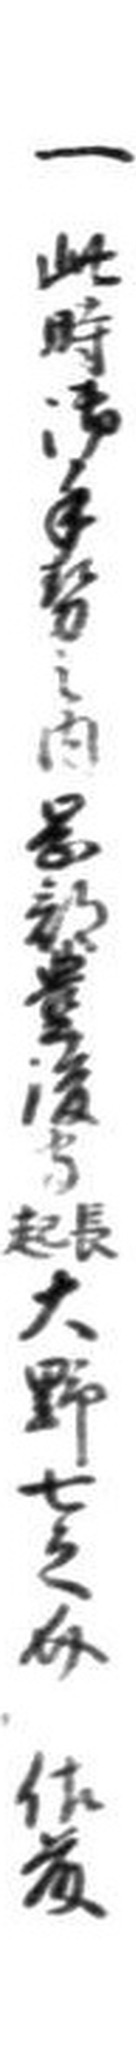一此時御手勢之内岡部豊後守長起大野七之介佐藤
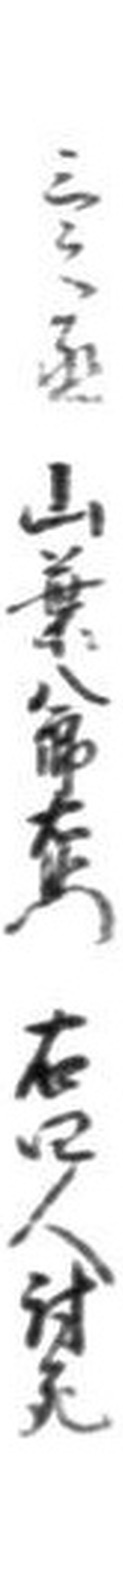三之丞山葉八郎右衛門右四人討死
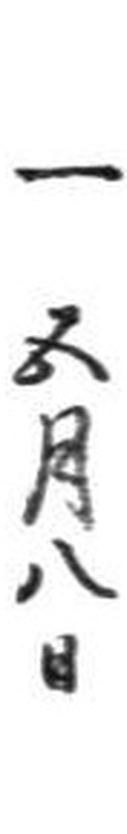一五月八日
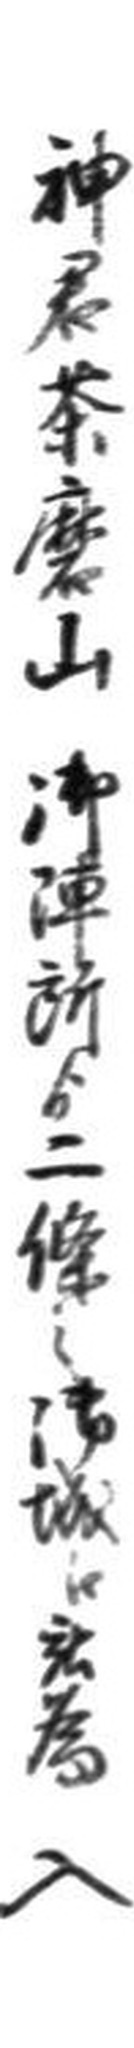神君茶磨山御陣所ゟ二条之御城江被為入
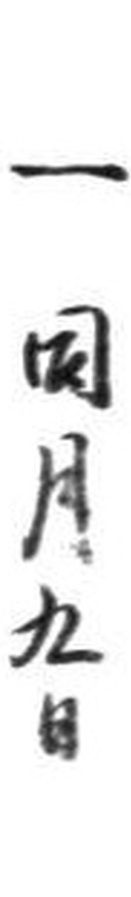一同月九日
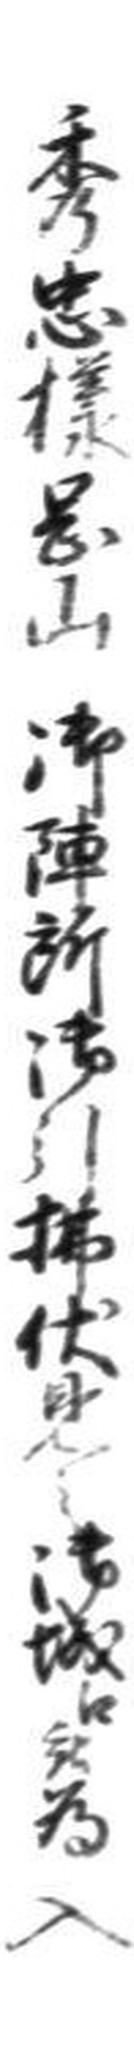秀忠様岡山御陣所御引払伏見之御城江被為入

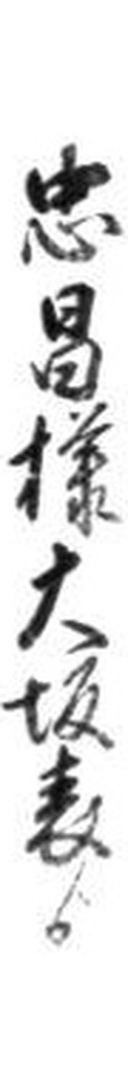忠昌様大坂表ゟ
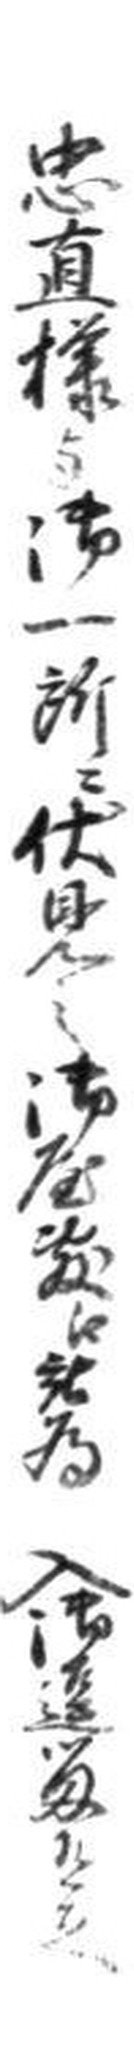忠直様と御一所ニ伏見之御屋敷江被為入御逗留有之
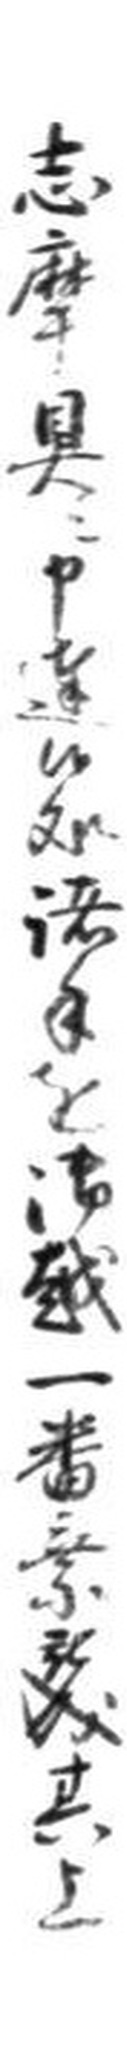志摩具ニ申達候処諸手を御越一番乗被成其上
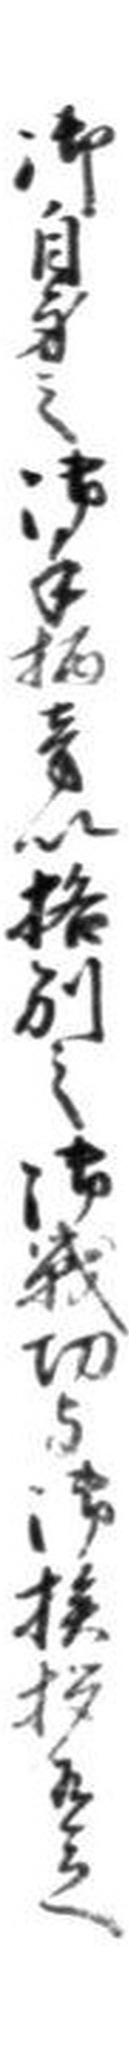御自身之御手柄旁以格別之御戦功と御挨拶有之
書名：家譜 三 忠昌公 従慶長八年到寛永六年
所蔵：福井県文書館 Fukui Prefectural Archives
